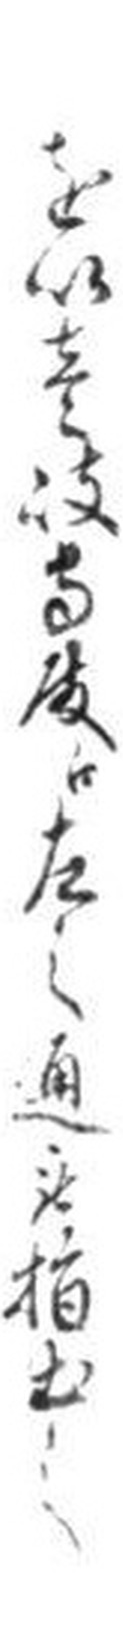を以壱岐守殿江左之通被指出之
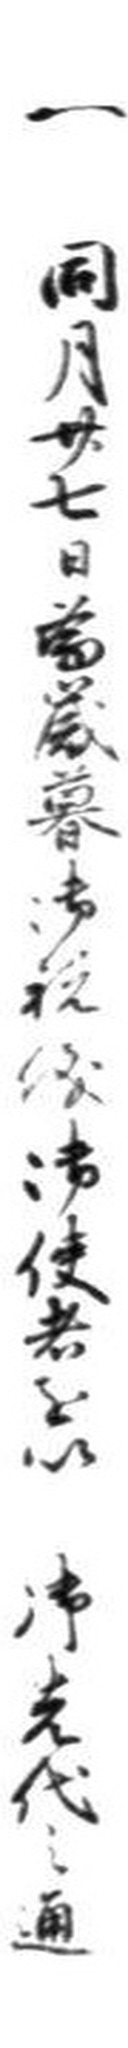一同月廿七日為歳暮御祝儀御使者を以御先代之通
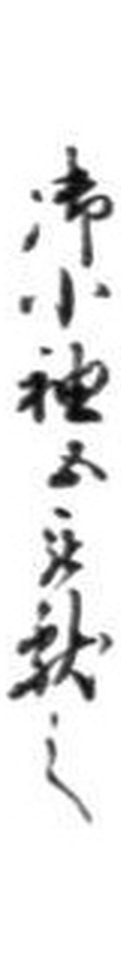御小袖五被献之
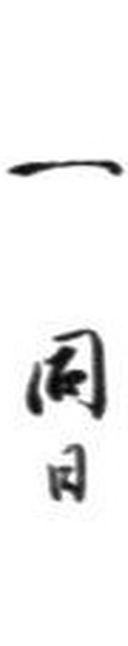一同日
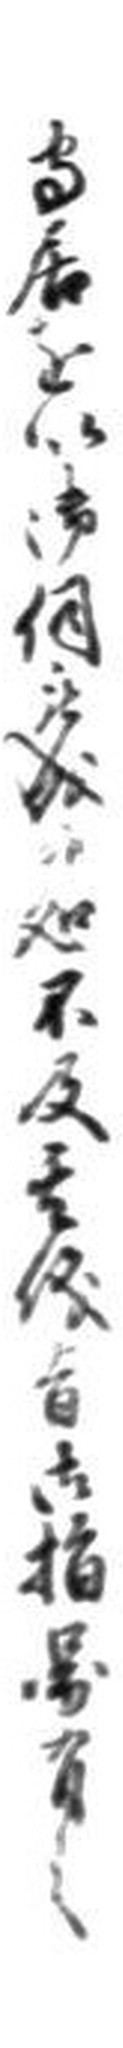守居を以御伺被成候処不及其儀旨御指図有之
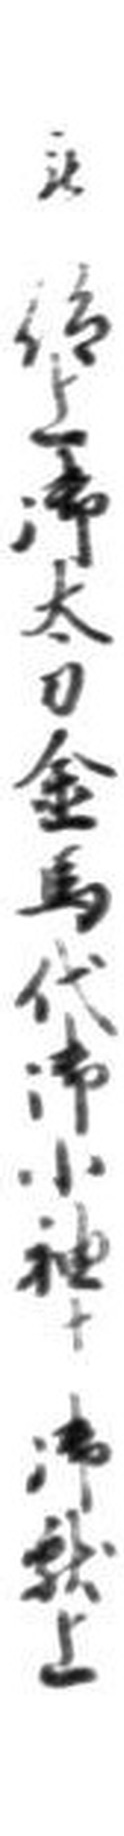被仰上御太刀金馬代御小袖十御献上
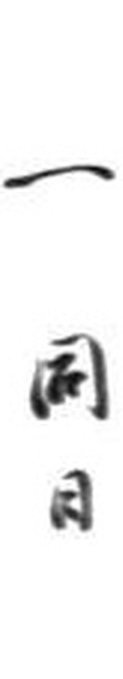一同日
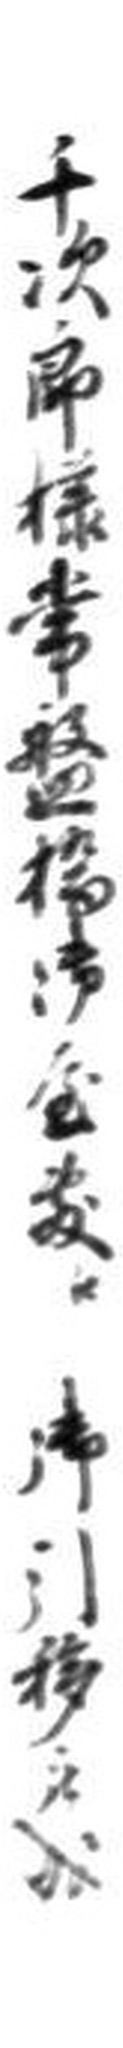千次郎様常盤橋御屋敷江御引移被成
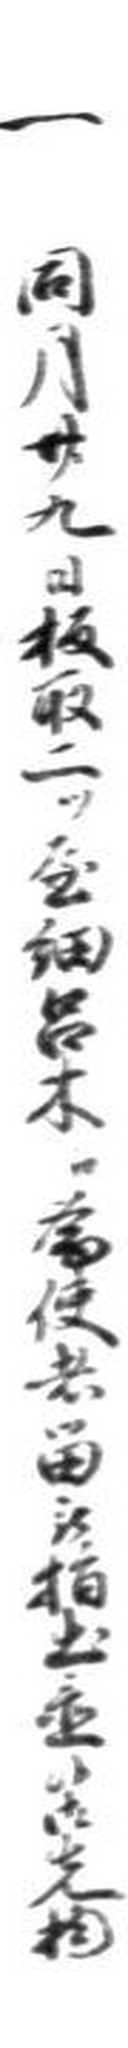一同月廿九日板取二ツ屋細呂木江為使者留被指出置候御先物
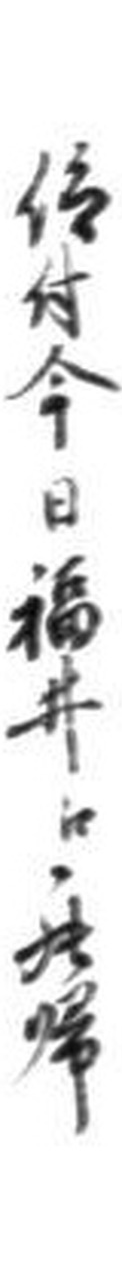仰付今日福井江罷帰

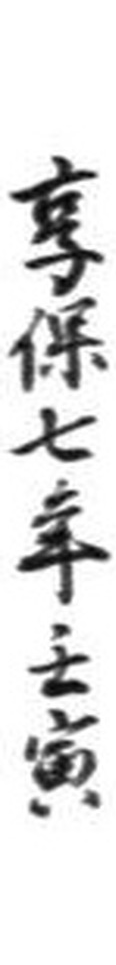享保七年壬寅
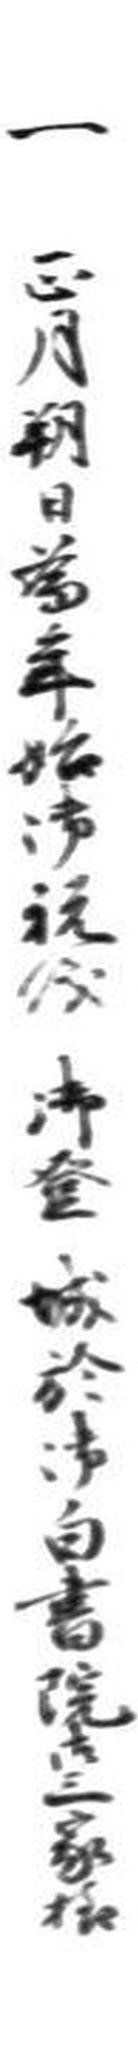一正月朔日為年始御祝儀御登城於御白書院御三家様
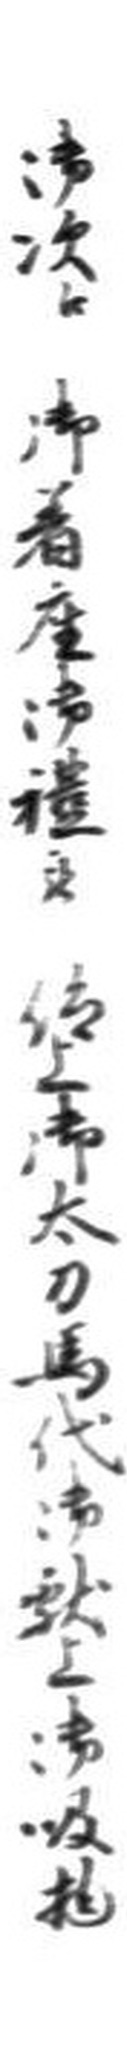御次江御着座御礼被仰上御太刀馬代御献上御吸物
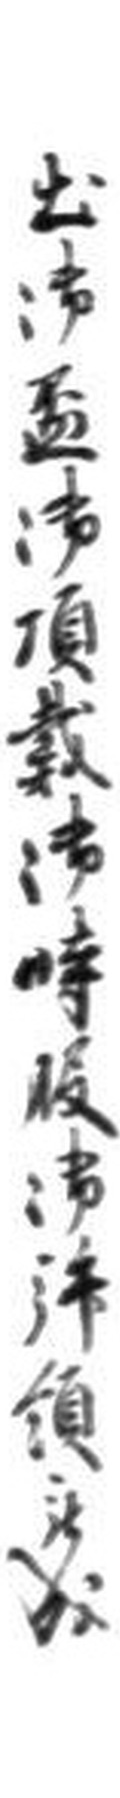出御盃御頂戴御時服御拝領被成
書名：家譜 三十五 宗昌公 従享保六年到同七年
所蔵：福井県文書館 Fukui Prefectural Archives
